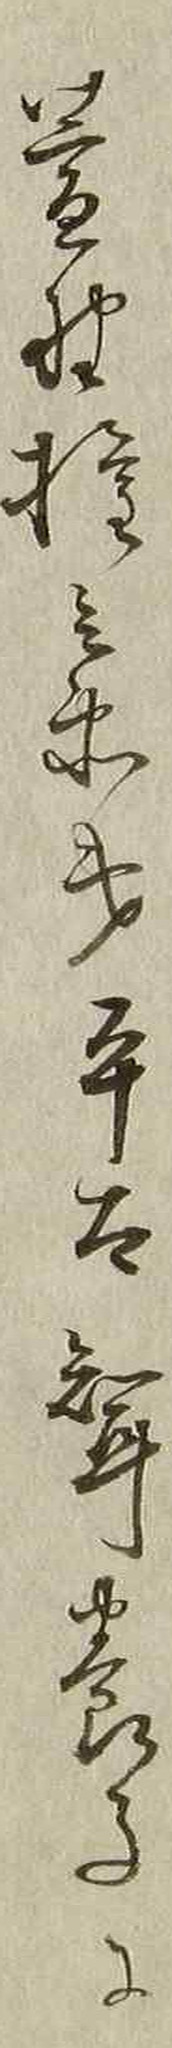萱野権兵衛弟平太婿養子に
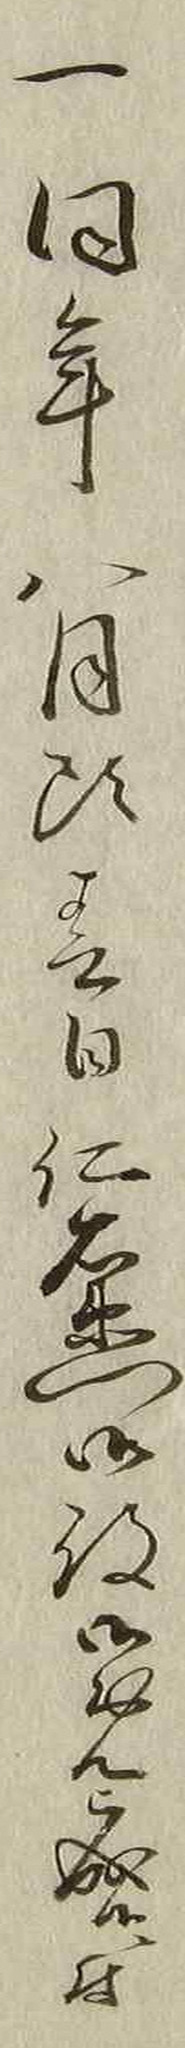一同年八月頃春日仁右衛門御役御免成られ候ニ付き
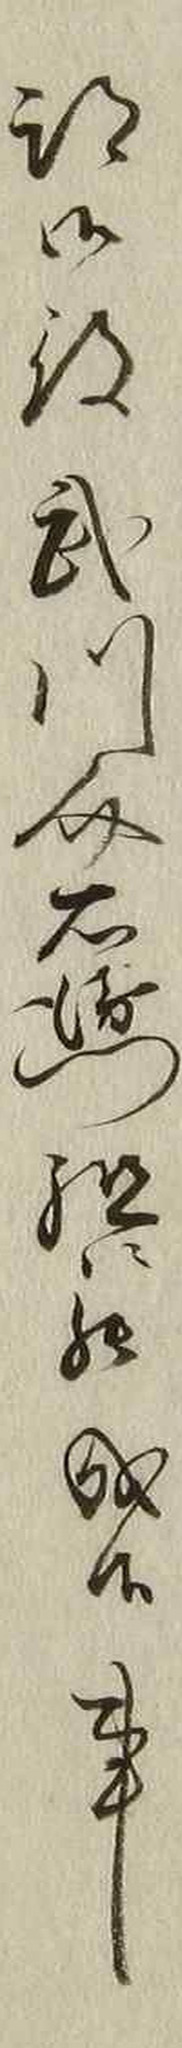跡御役武川介右衛門組ニ罷り成り候事
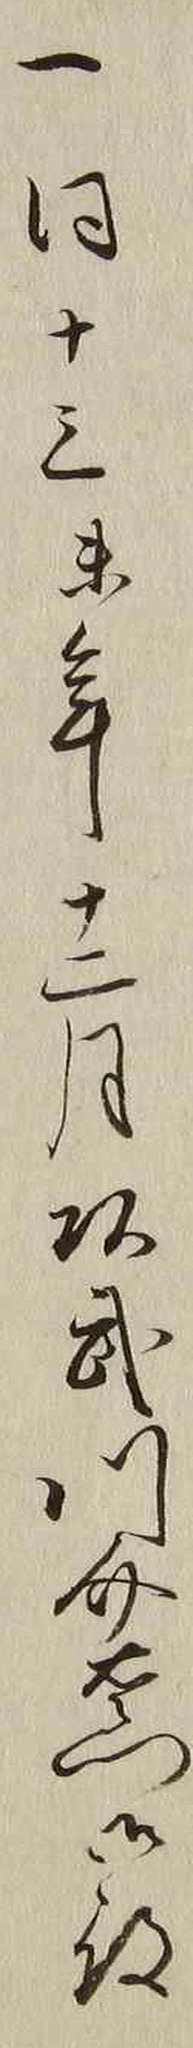一同十三未年十二月頭武川介右衛門御役
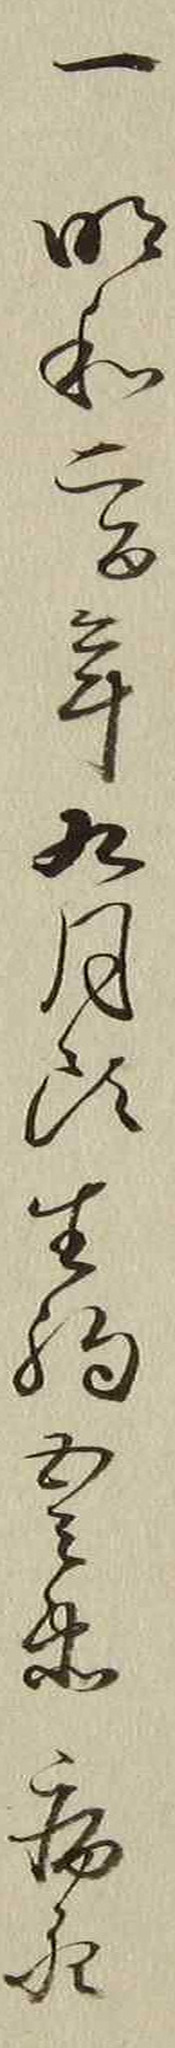一明和二酉年九月頃生駒五兵衛病死
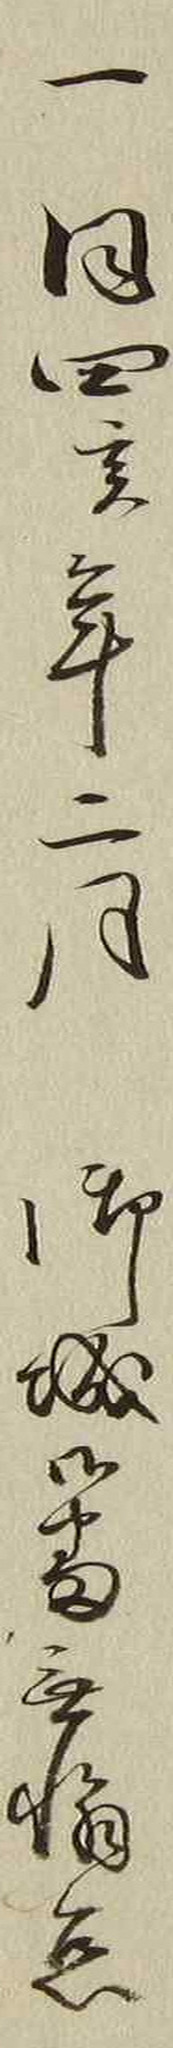一同四亥年二月御城御番懈怠無く
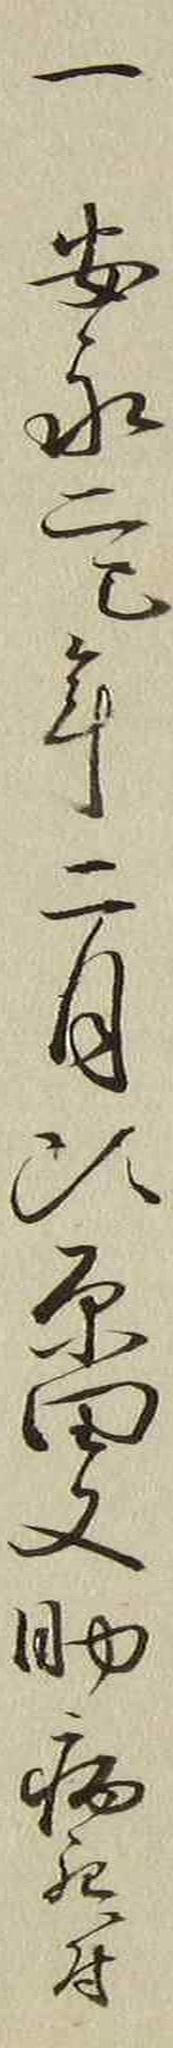一安永二巳年二月頃原田又助病死ニ付き
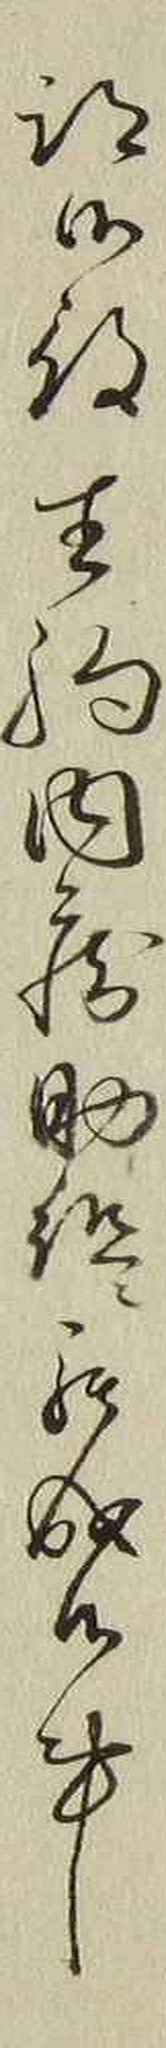跡御役生駒内蔵助組ニ罷り成り候事
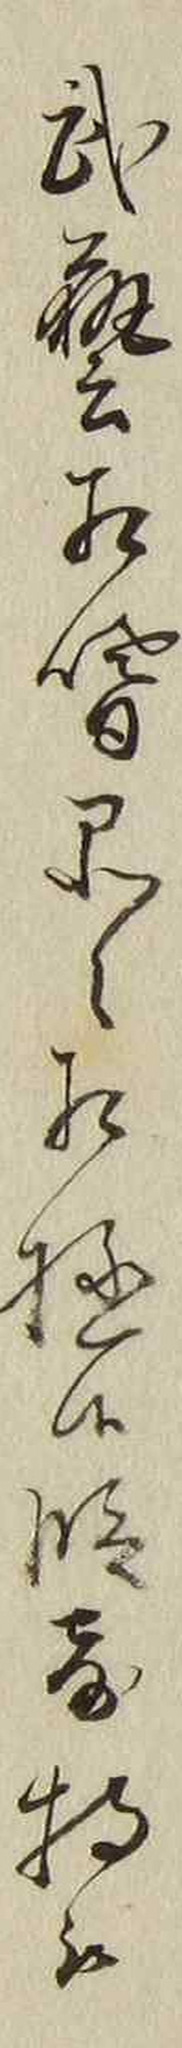武芸相嗜品々相極め候段奇特

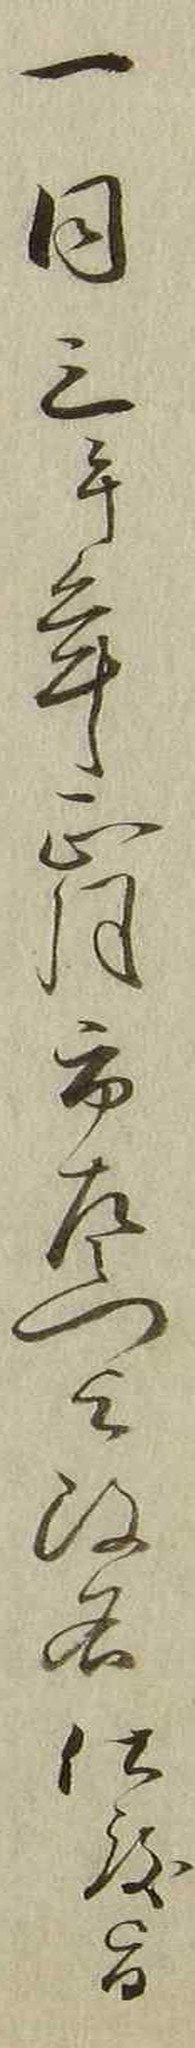一同三午年正月市左衛門と改名仕り度旨
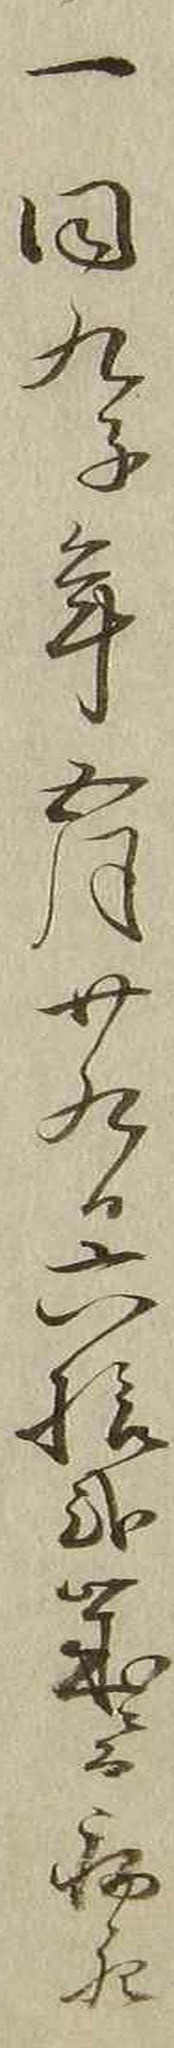一同九子年五月廿九日六拾弐歳ニて病死
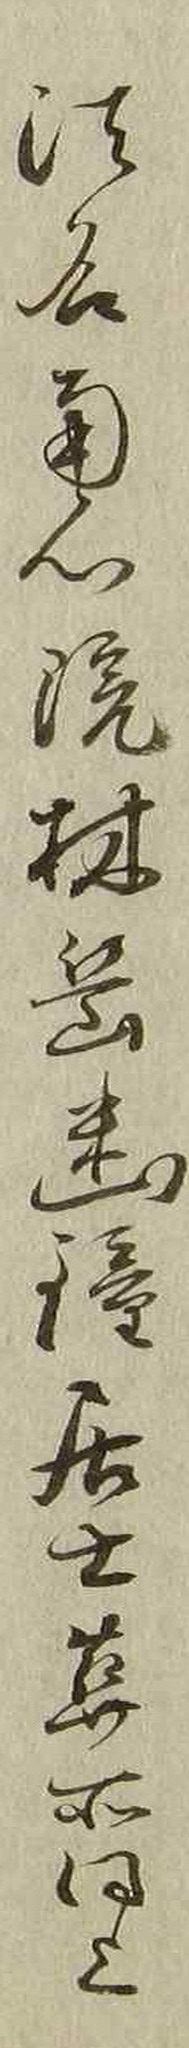法名南心院林岳函鐘居士葬所同上
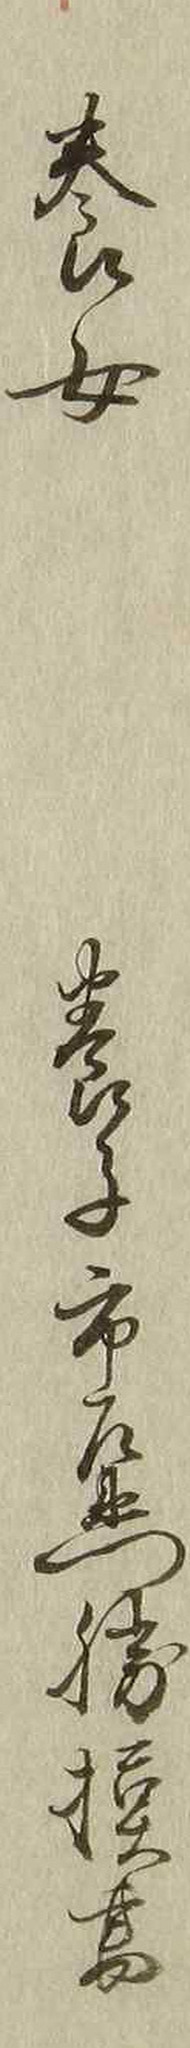養女養子市左衛門勝模妻
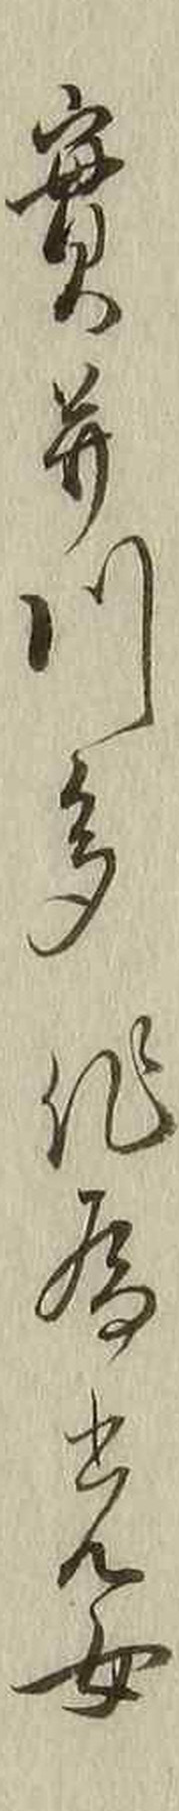実并川多作為光女
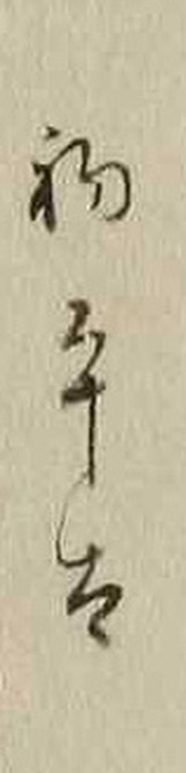初午太
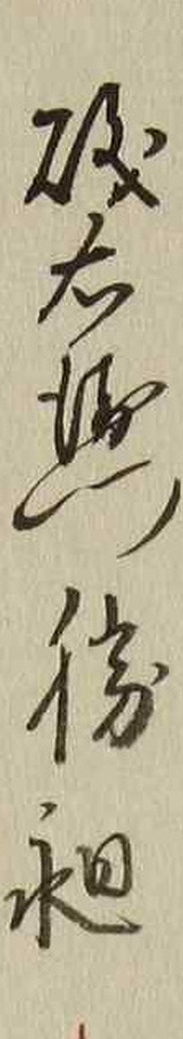磯右衛門勝昶
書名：諸士系譜　巻之20　い之部20
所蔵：会津若松市立会津図書館
